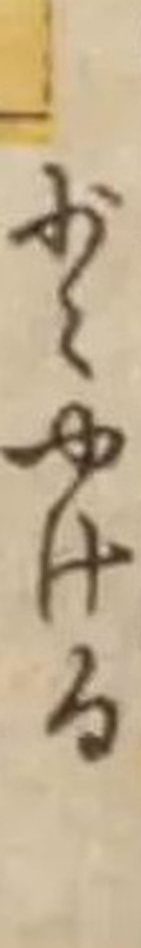少しやける
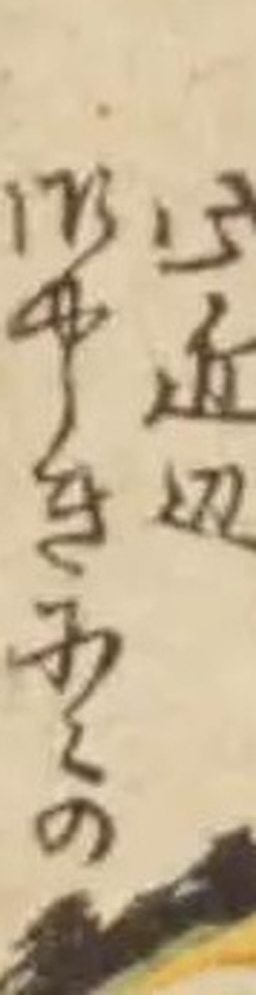御やしき少々の
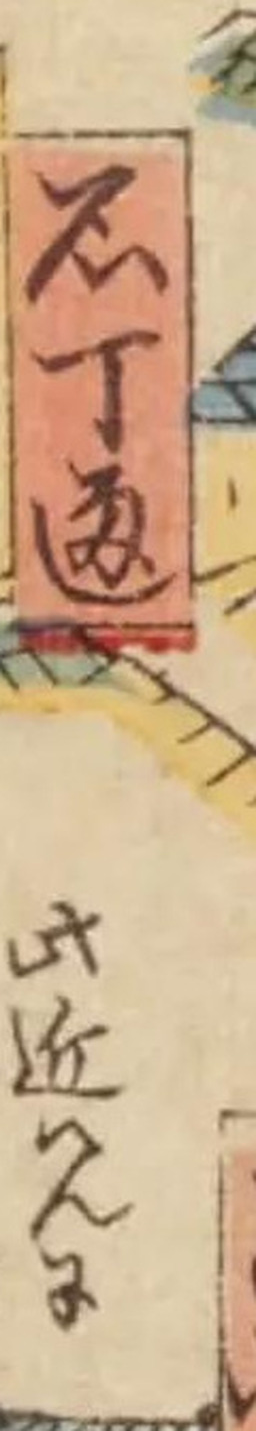此近へんに
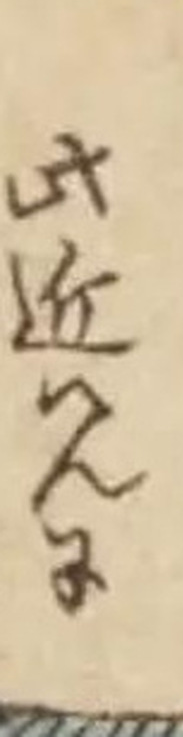此近へんに
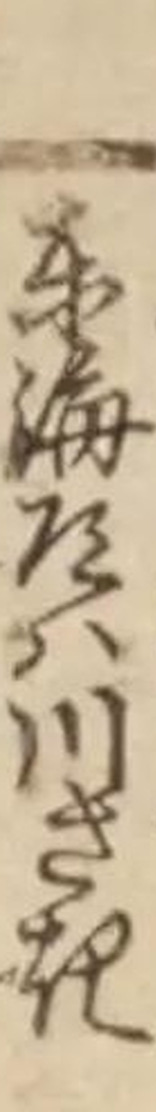東海道は川さき
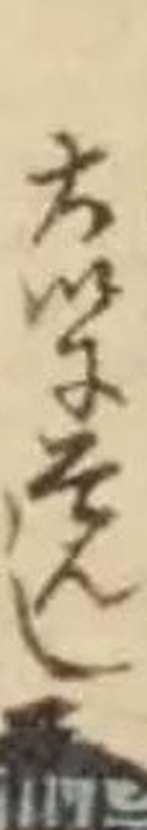大いにそんじ
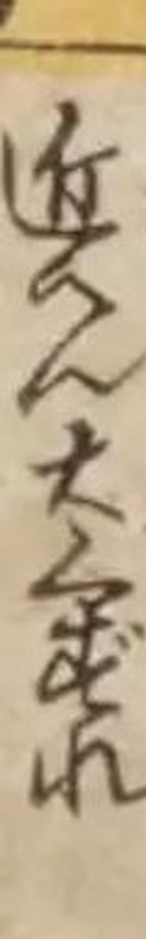通へん大くずれ
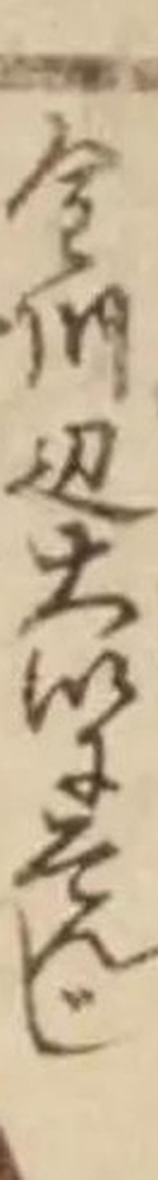金川辺大いにそんじ
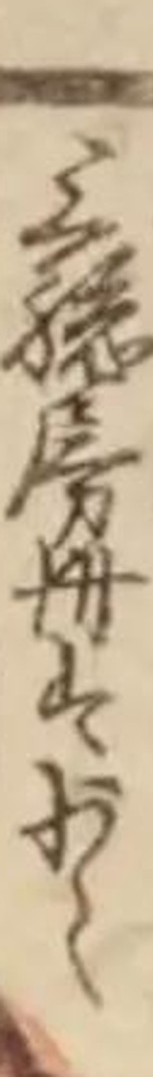上総房州は少々
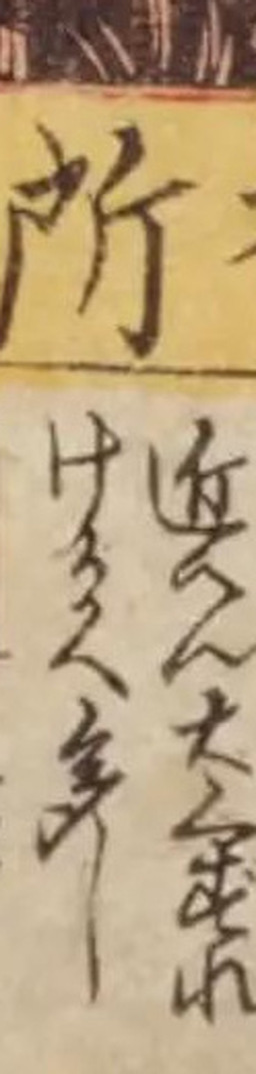けが人多し
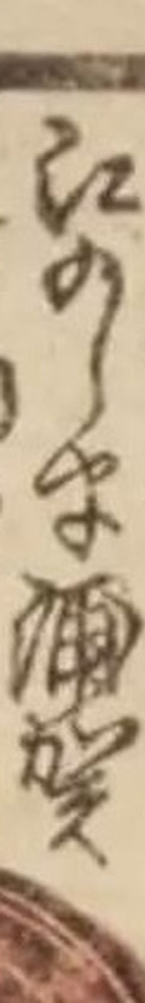江のしま浦賀
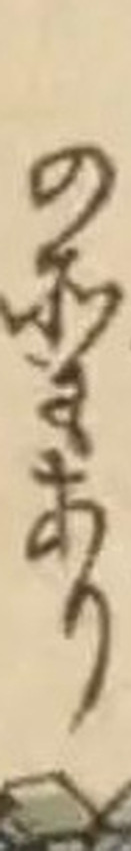の所もあり
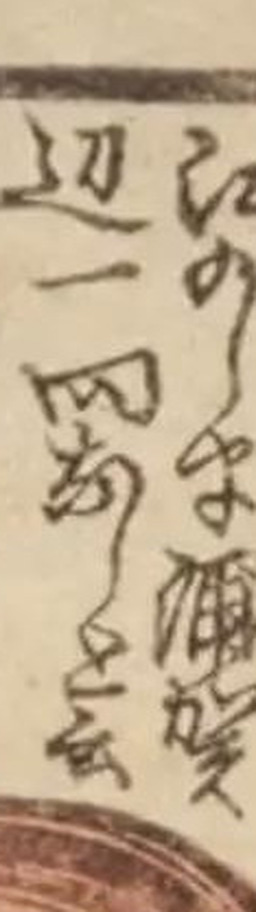辺一なしと云
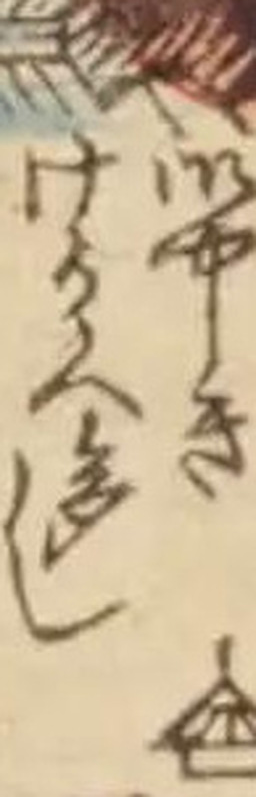けか人多し
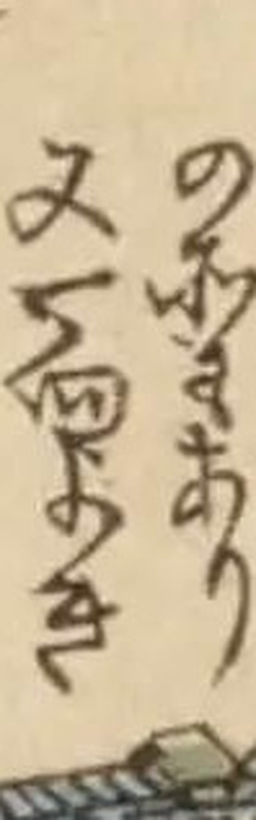又一向よき
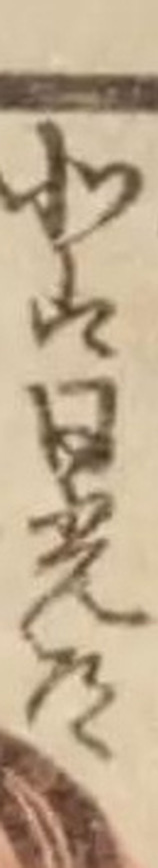北は日光道
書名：銘細改板江戸大地震出火場所附
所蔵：国立国会図書館 National Diet Library, JAPAN
